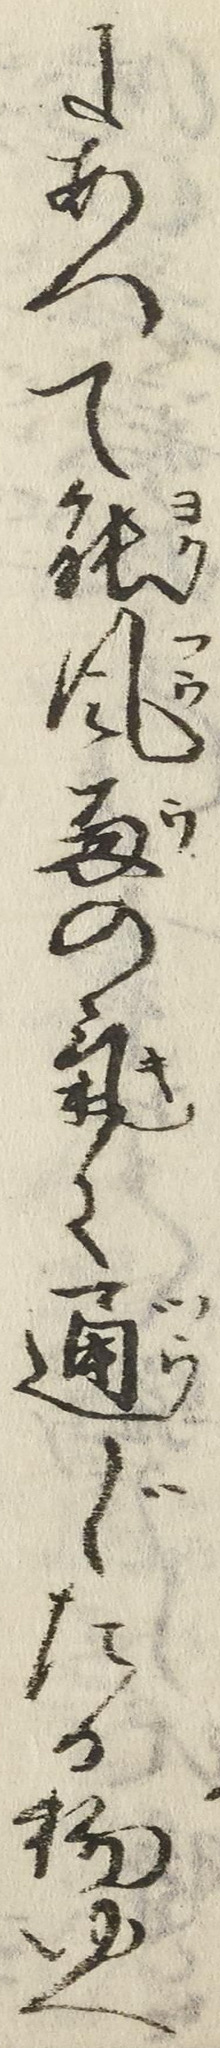にあつて能風雨の気に通じたる物ゆへ
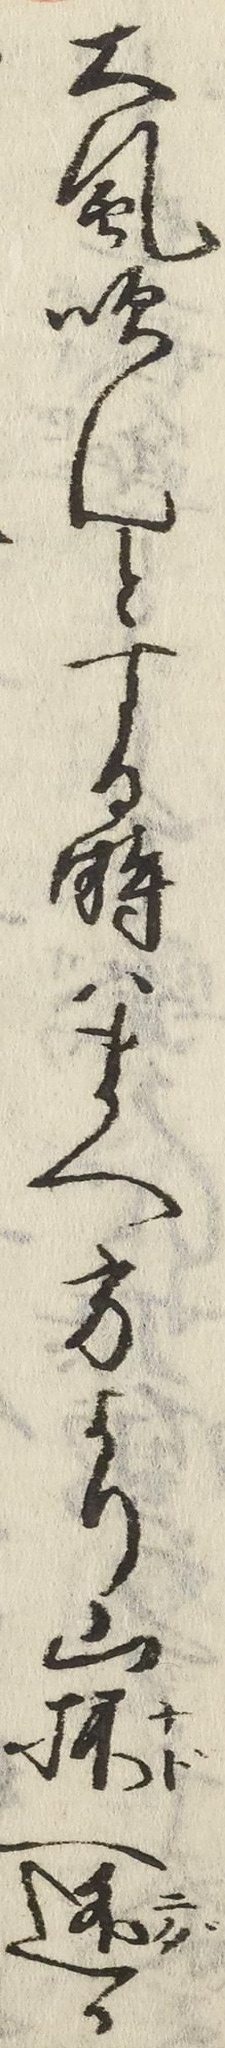大風吹んとする時はまへ方より山抔へ逃る
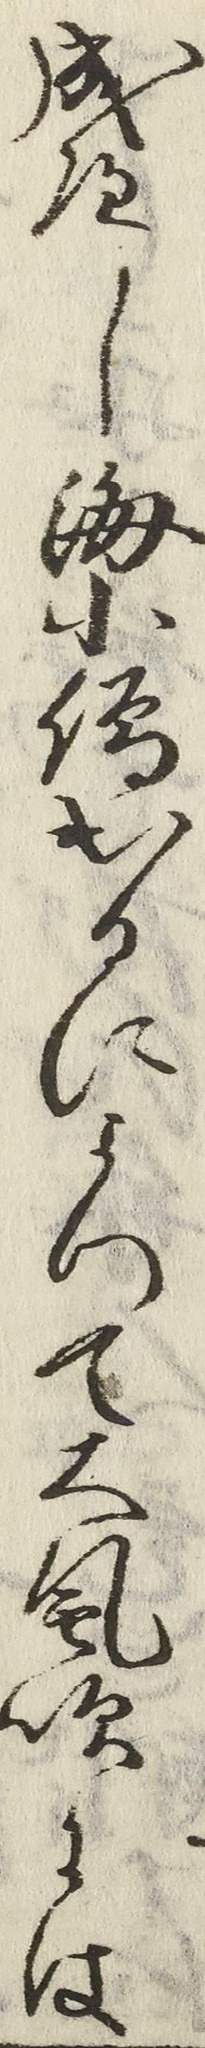成へし海小僧出るによつて大風吹には
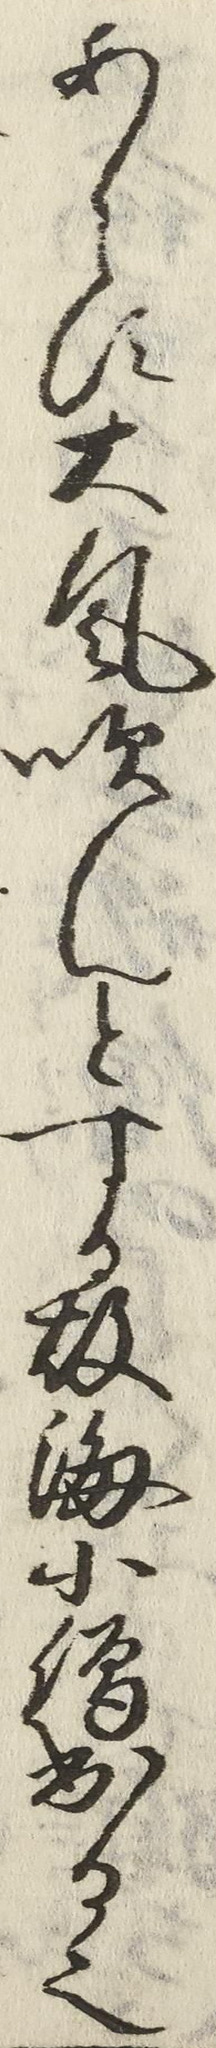あらす大風吹んとする故海小僧出る也
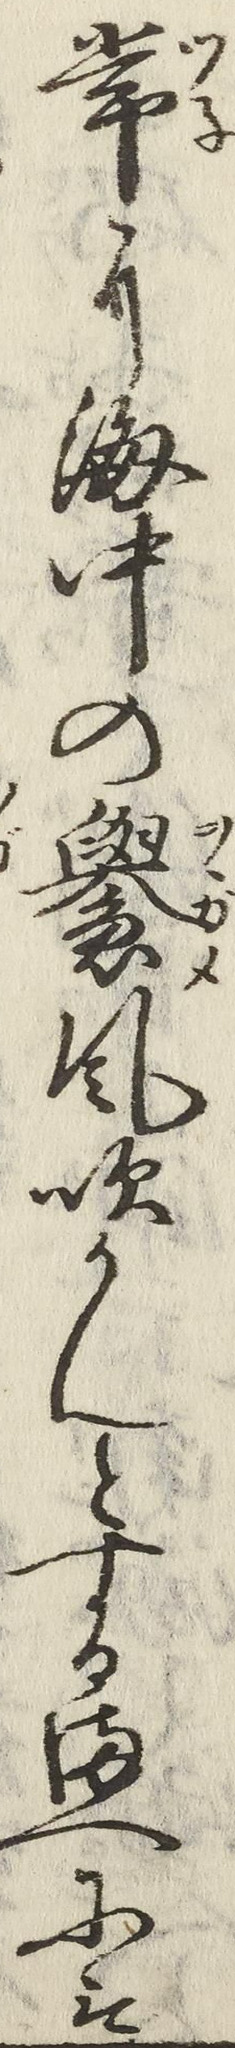常に海中の鱟風吹かんとするまへには
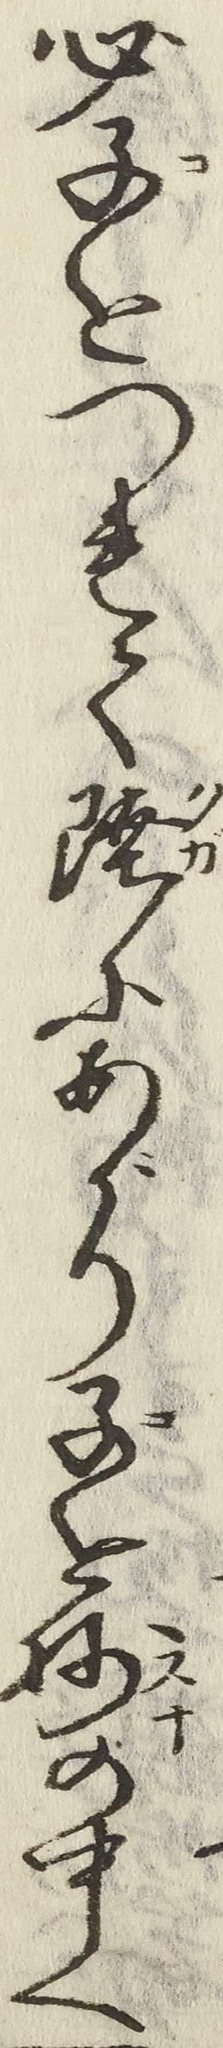必子をつれて陸にあがあり子を砂の中へ
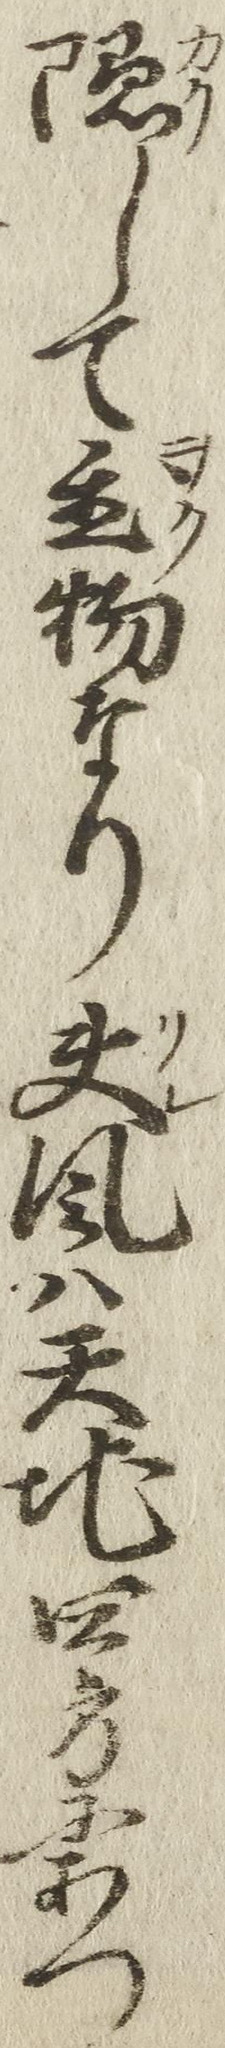隠して置物なり夫風は天地四方にあつ
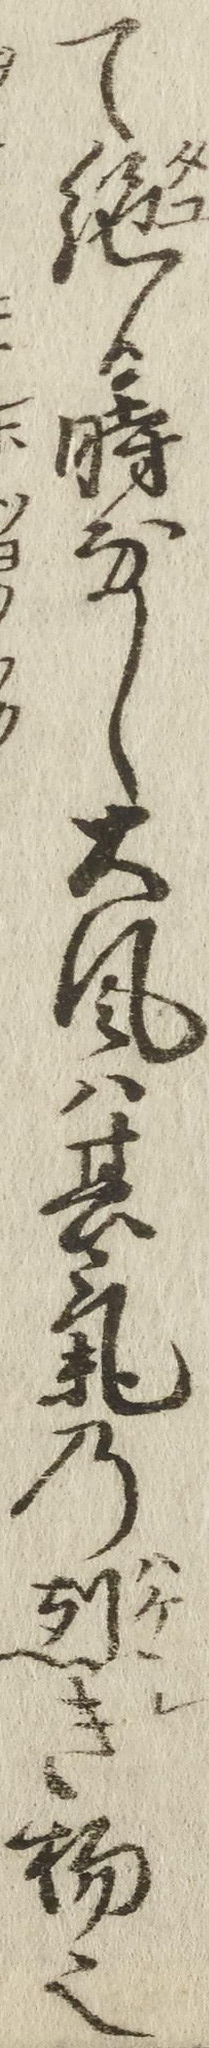て絶る時なし大風は其気の烈き物也
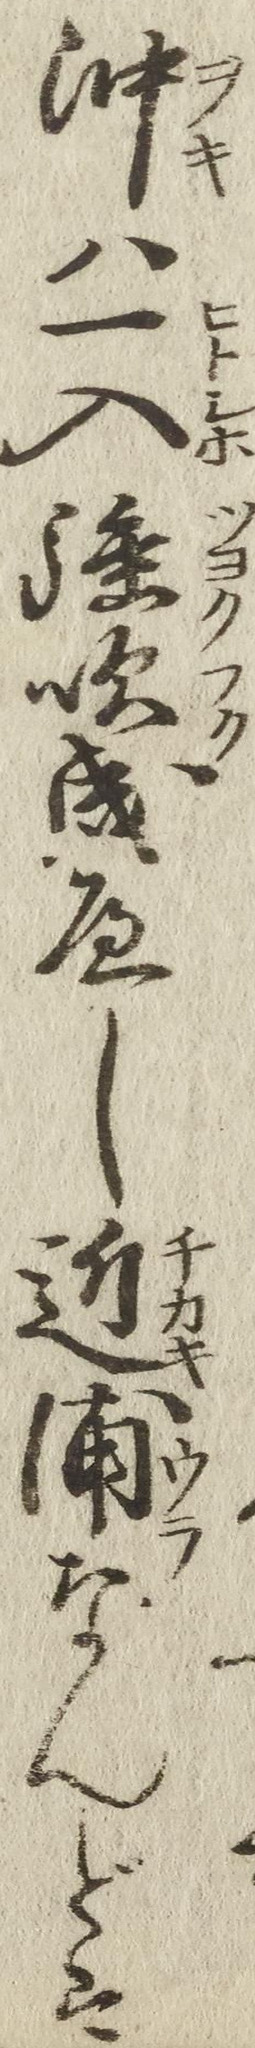沖は一入強吹成へし近浦なんどは
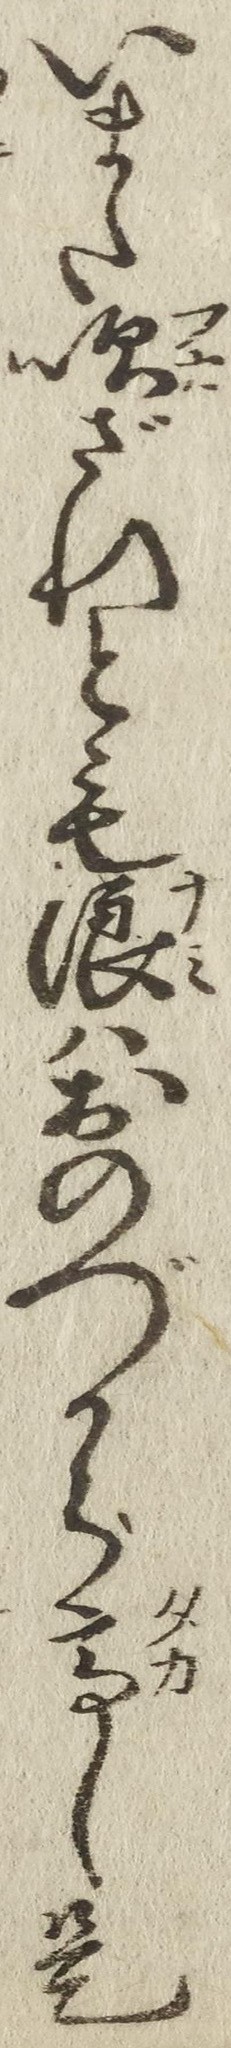いまた吹ざれとも浪はおのづから高し是
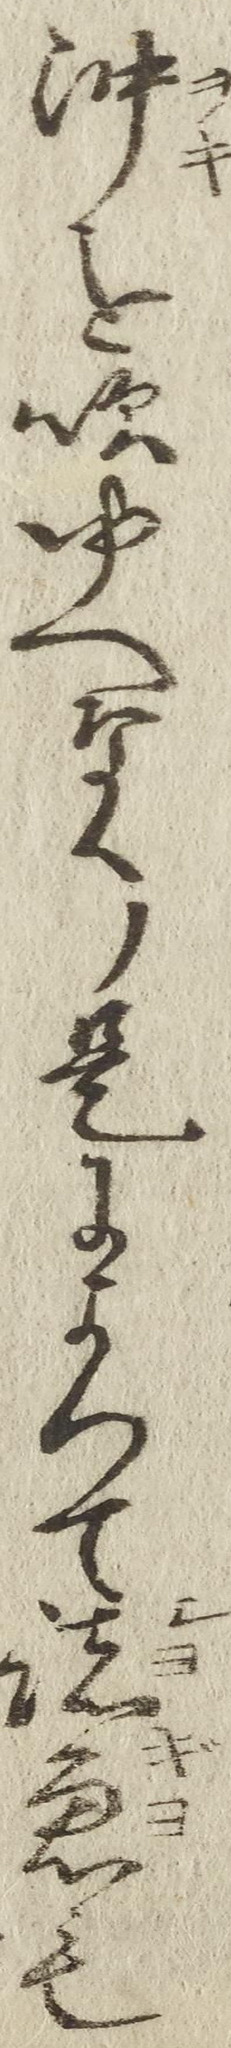沖を吹ゆへなり是によつて諸魚も
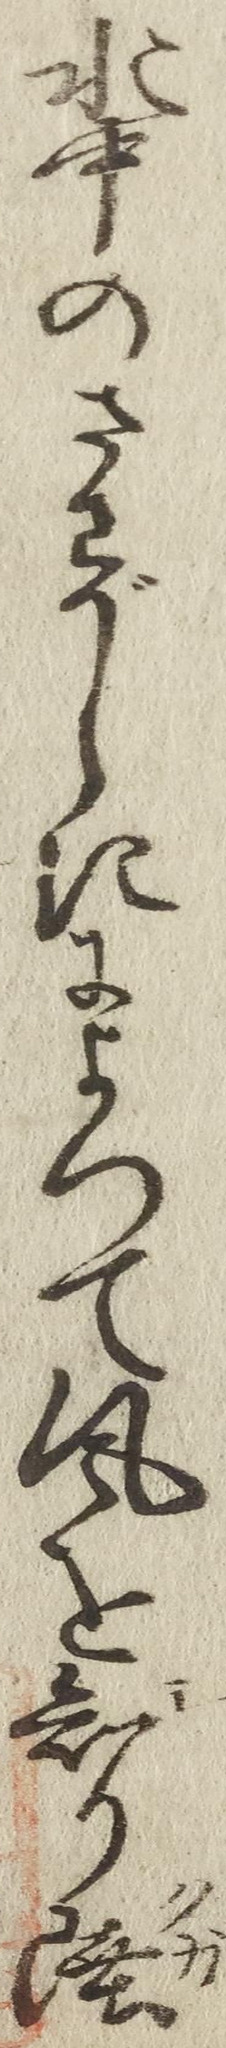水中のさわがしきによつて風を知り陸
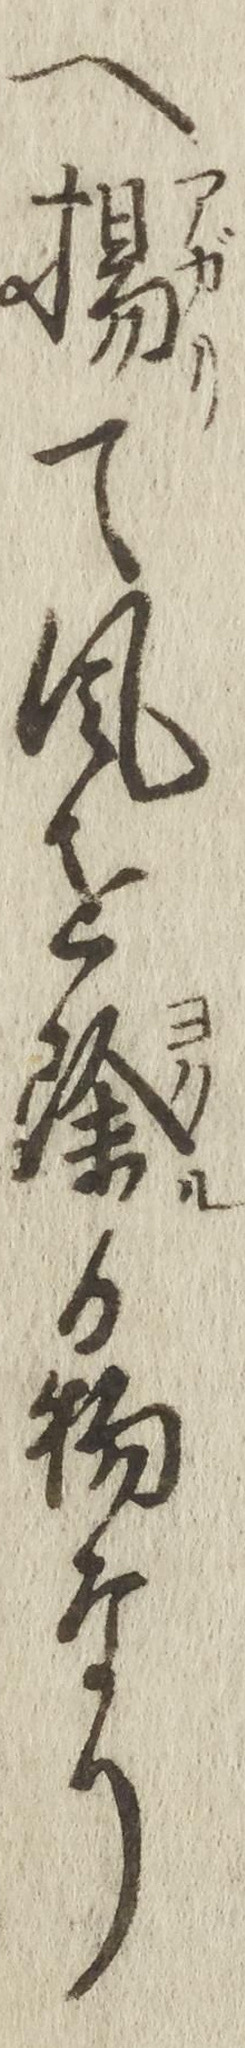へ揚て風を除る物なり
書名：天地或問珍　天
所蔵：東京大学地震研究所図書室 Earthquake Research Institute Library, The University of Tokyo, JAPAN
